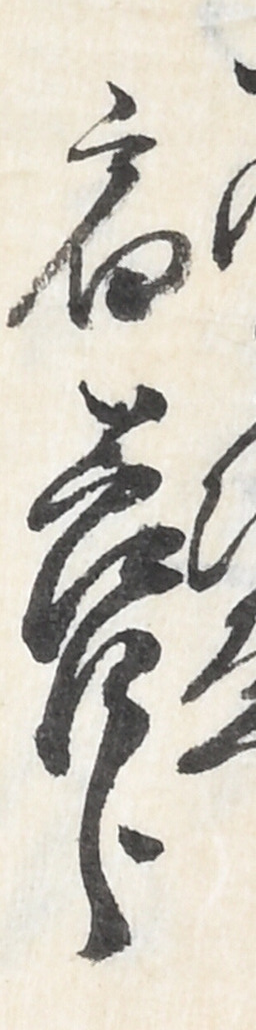宿忠左衛門
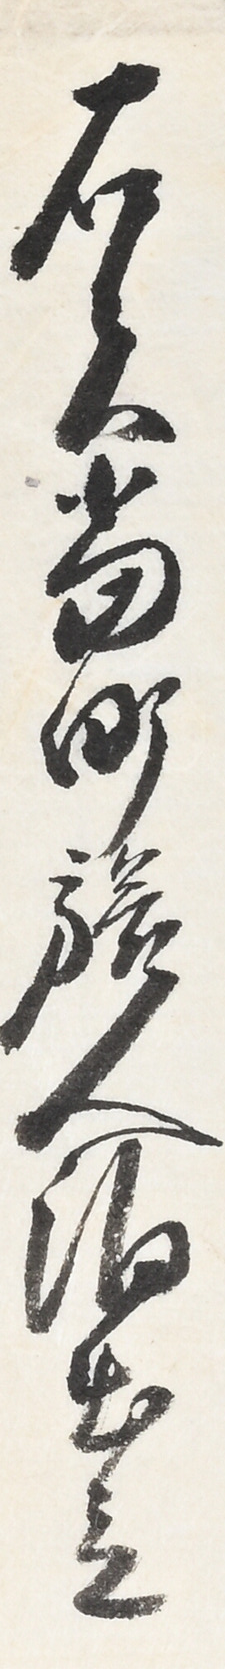右者当町旅人泊出立
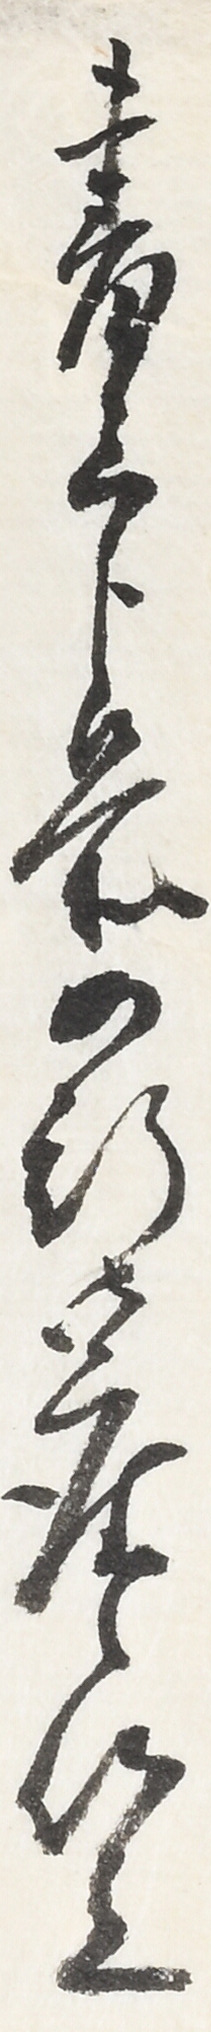書上申候所如斯御座候以上
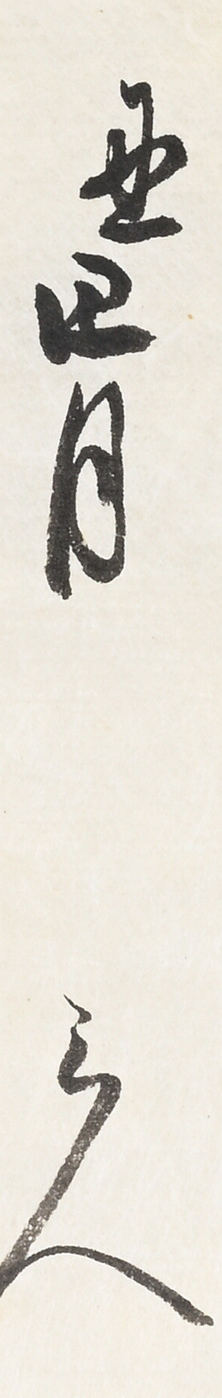丑四月三人
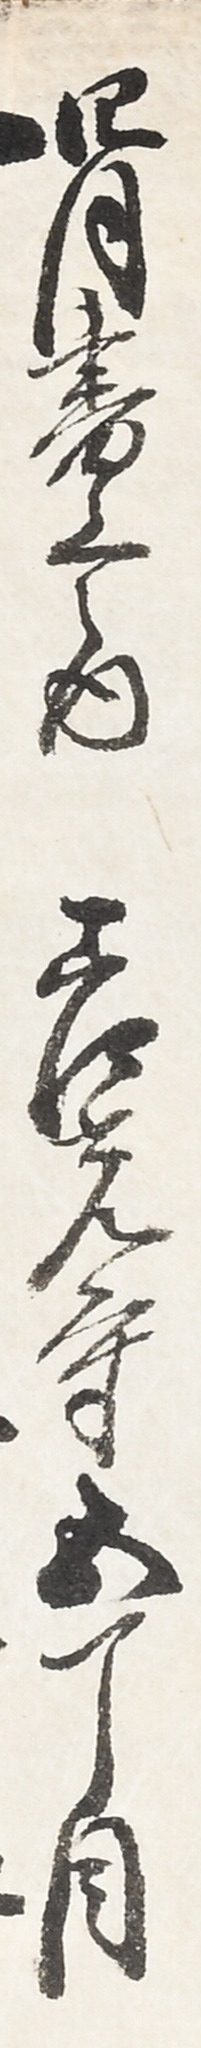四月書上之内善光寺五丁目
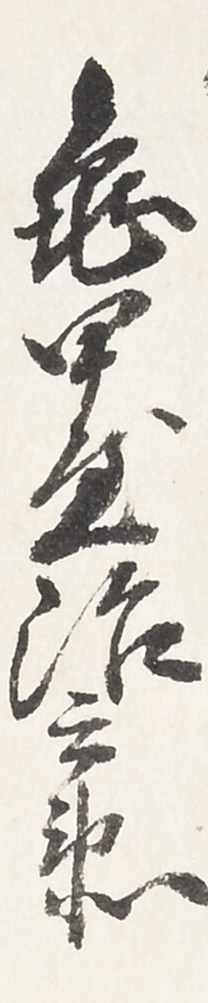一亀甲屋治兵衛
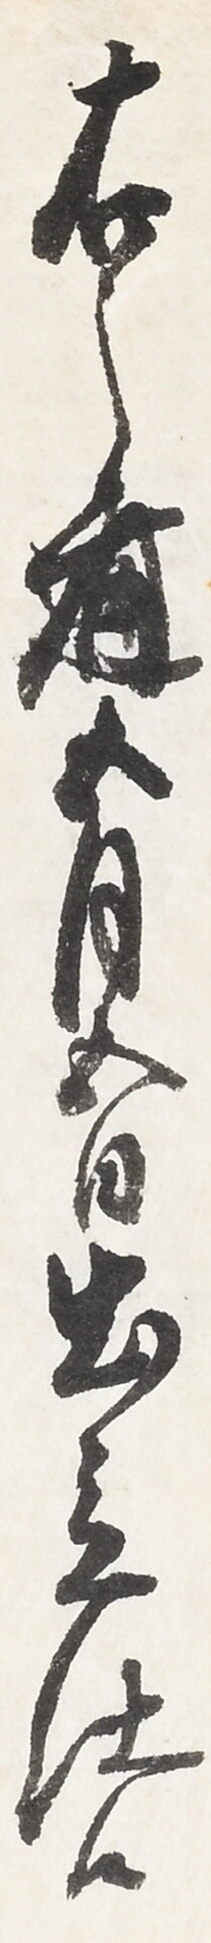右之者五月五日出立仕候
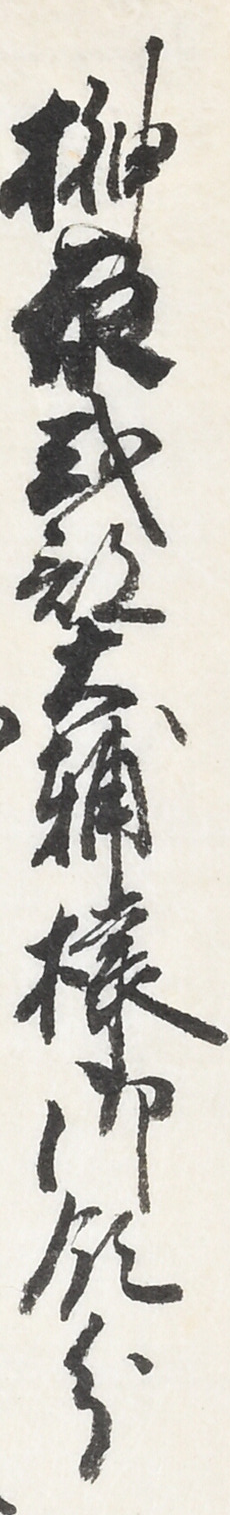榊原式部大輔様御領分
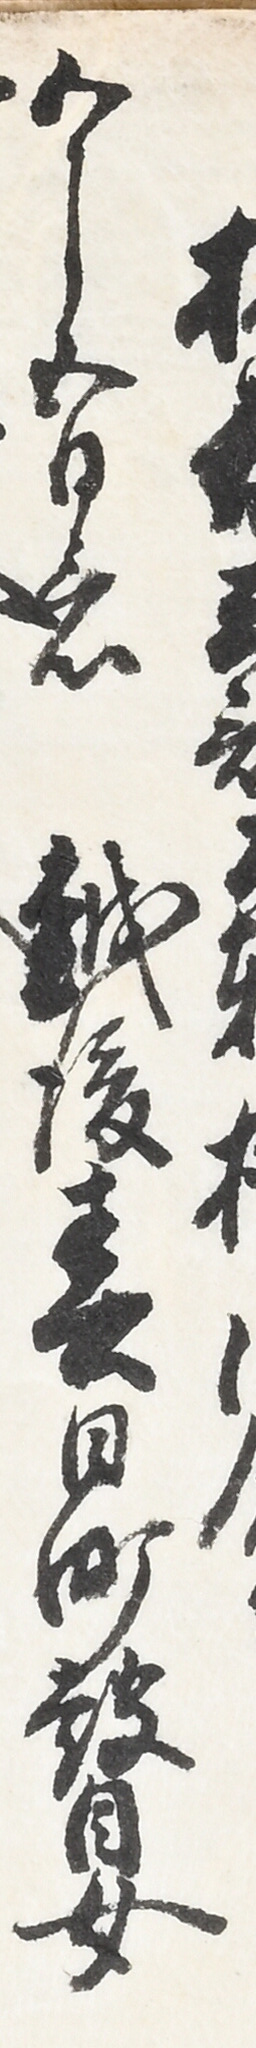五月五日着越後春日町瞽女
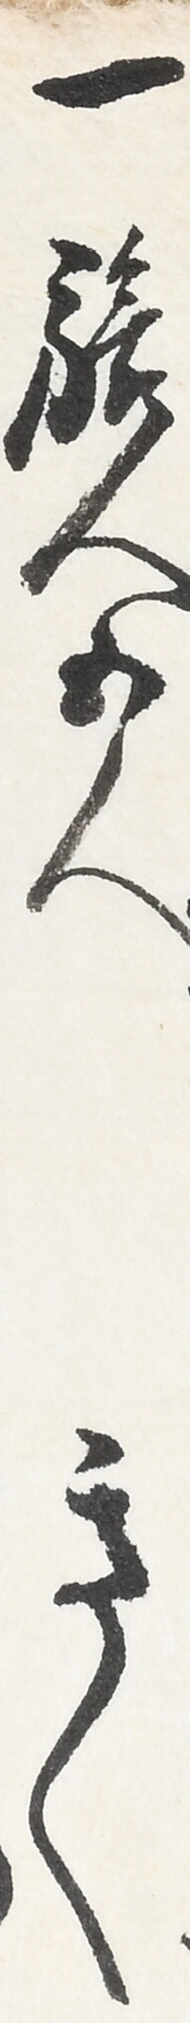一旅人五人きく
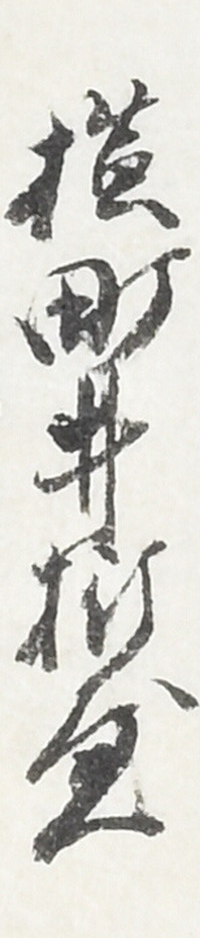横町井桁屋
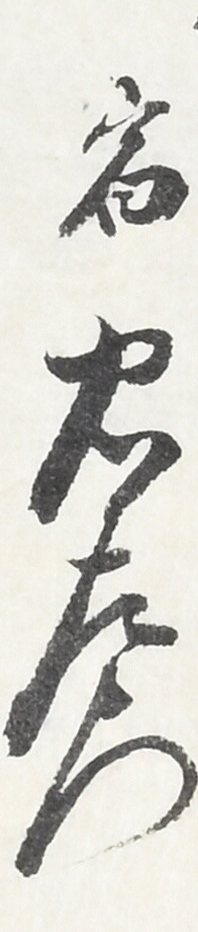宿忠左衛門
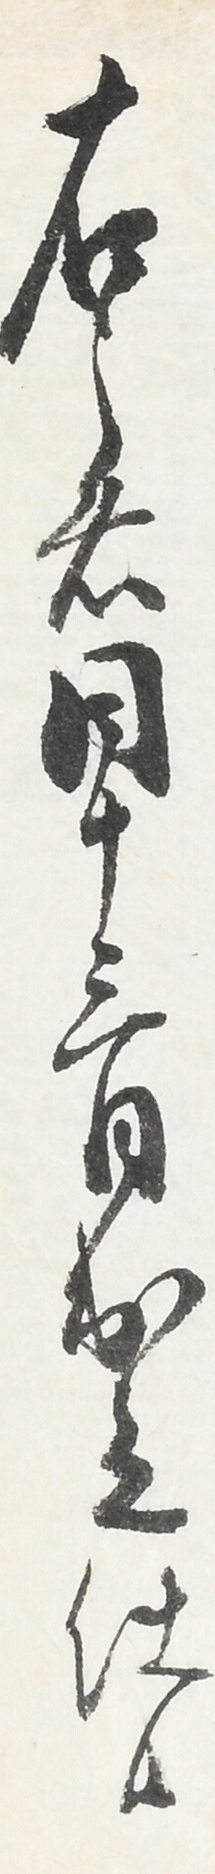右之者同十三日出立仕候

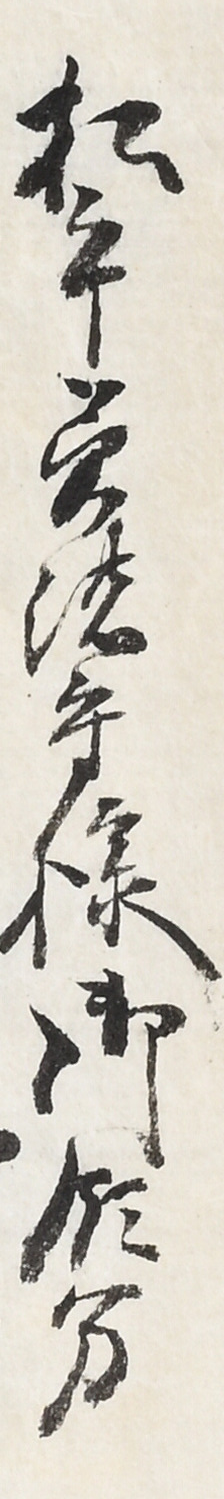松平美濃守様御領分
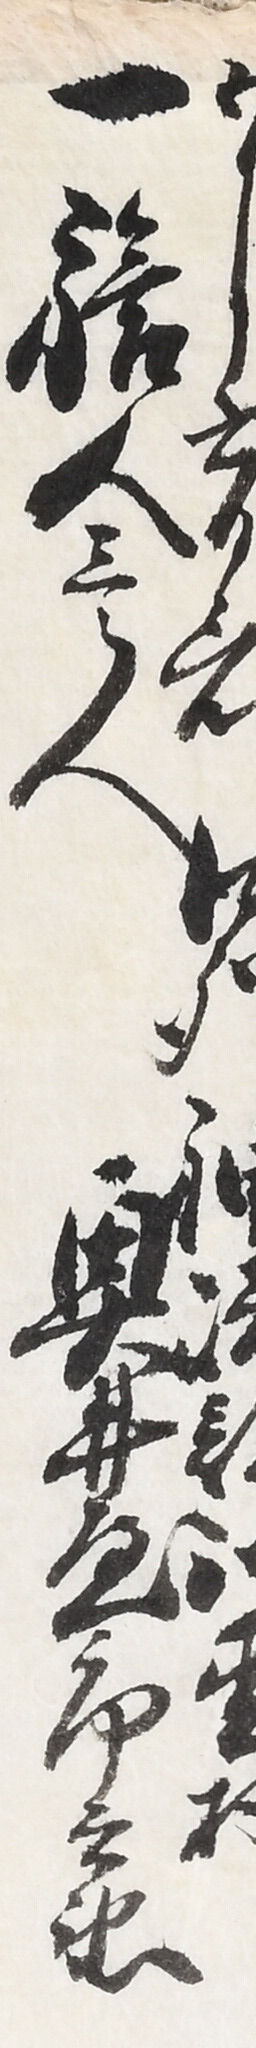一旅人三人奥井屋市兵衛
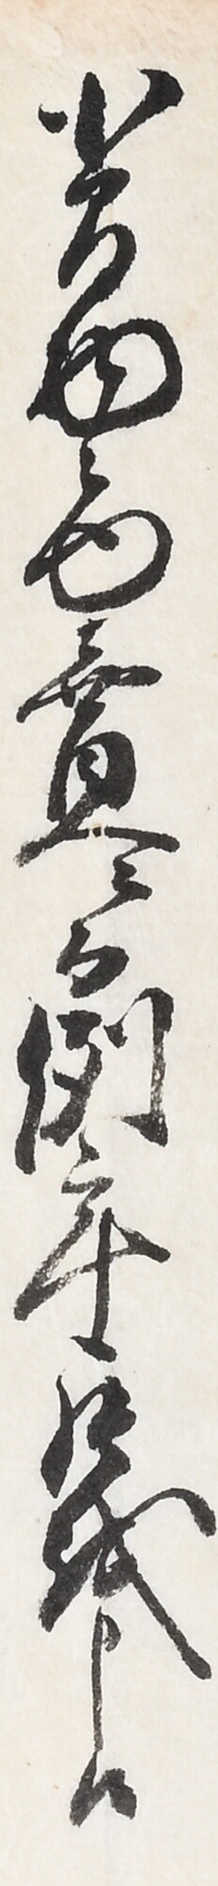小間物商売ニ而例年罷越申候
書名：旅人泊控帳
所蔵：伊那市立高遠町図書館・合同会社AMANE
